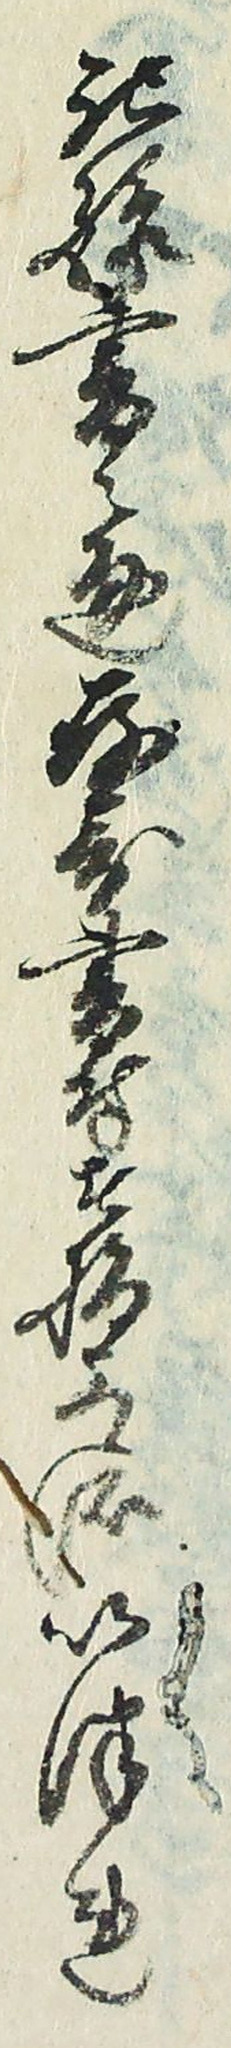記録書の通存寄書付奉指上候所いつれ
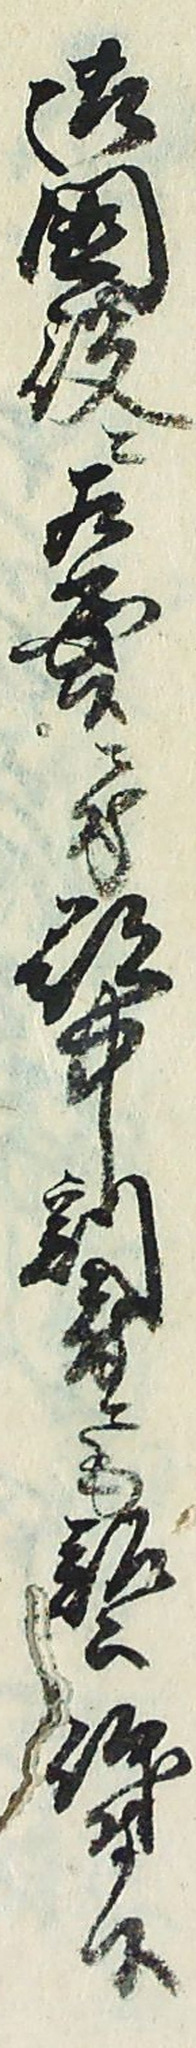御国役に相当候に付郡中割符にも難被仰付候
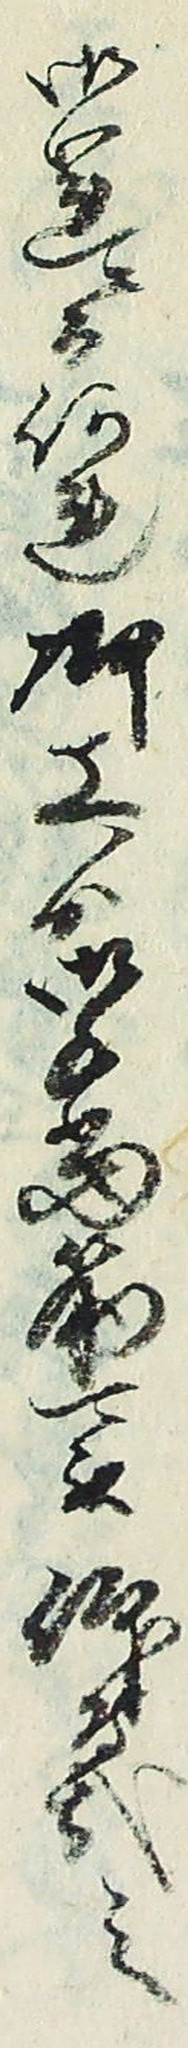御運にて何れ御上より御手当筋可被仰付哉の
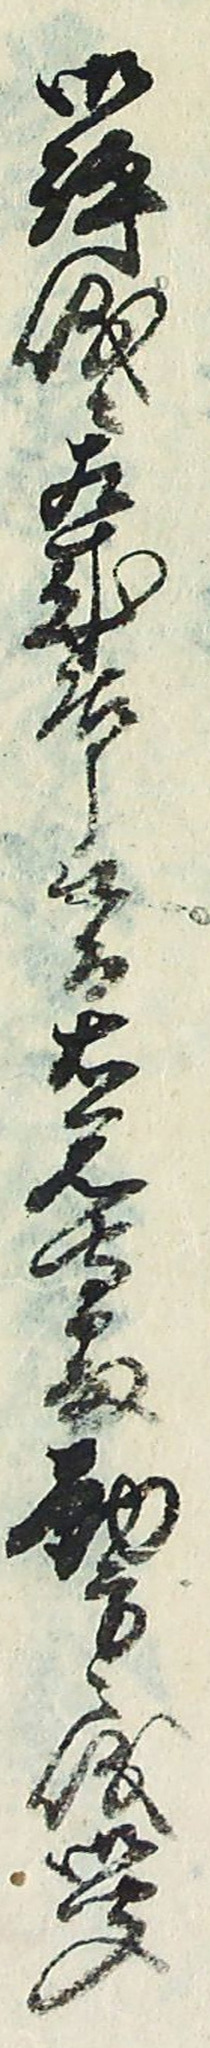御評儀に相成居申候旨右見守番勤方の儀御聞
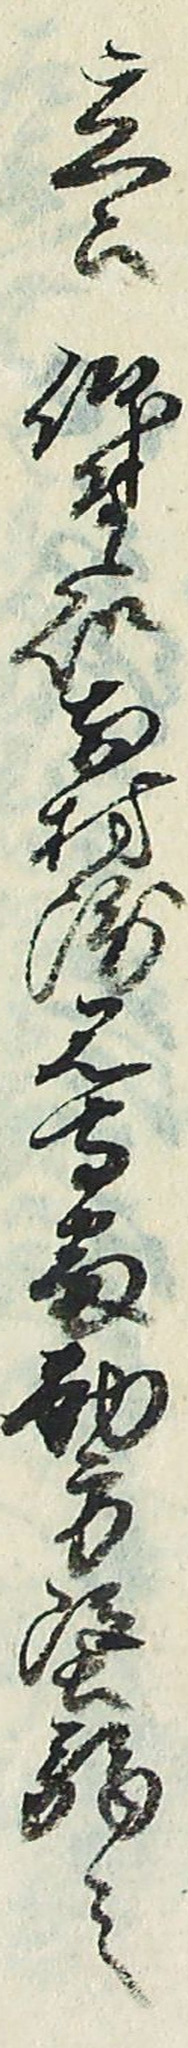立被仰付候処当村浦見守番勤方堅弱の
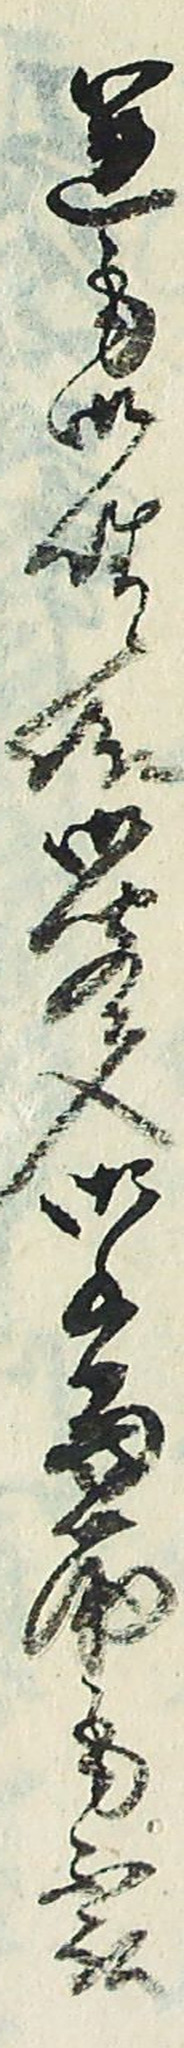運も御坐候様御聞入御手当筋も不被
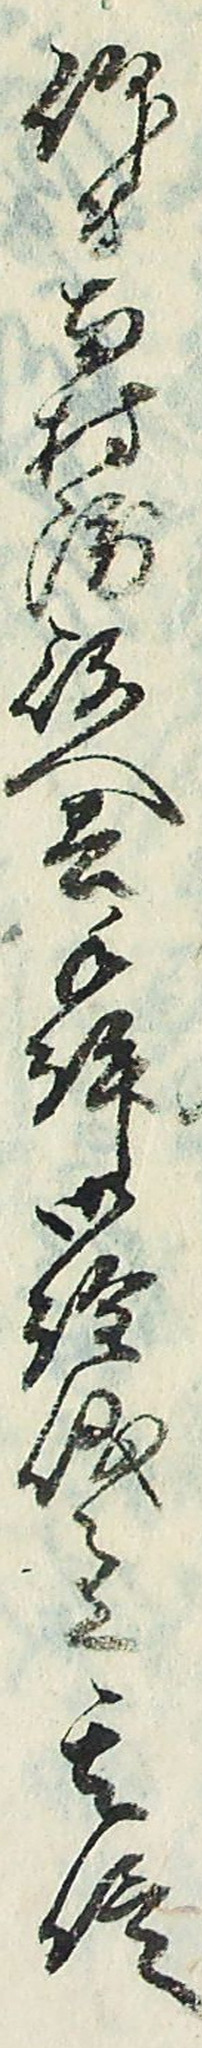仰付両村浦役人共手許御詮儀の上其儘
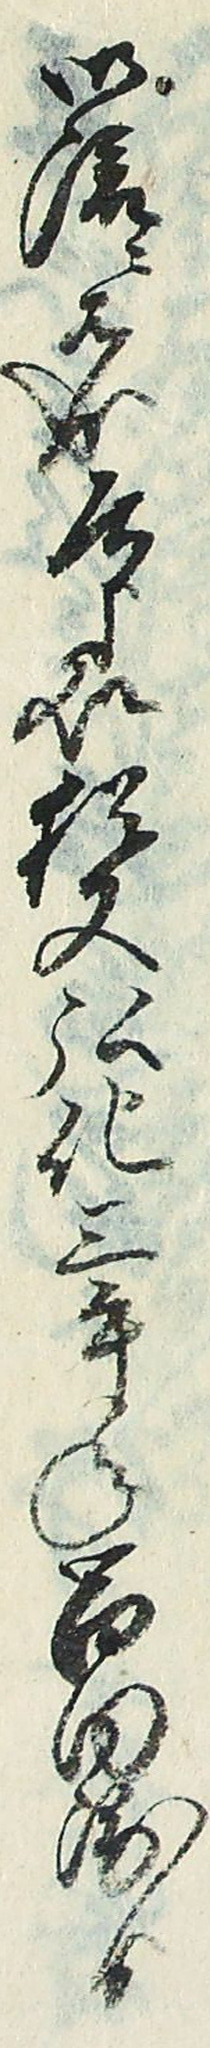御流に相成居申候処猶又弘化三午年冨田浦より

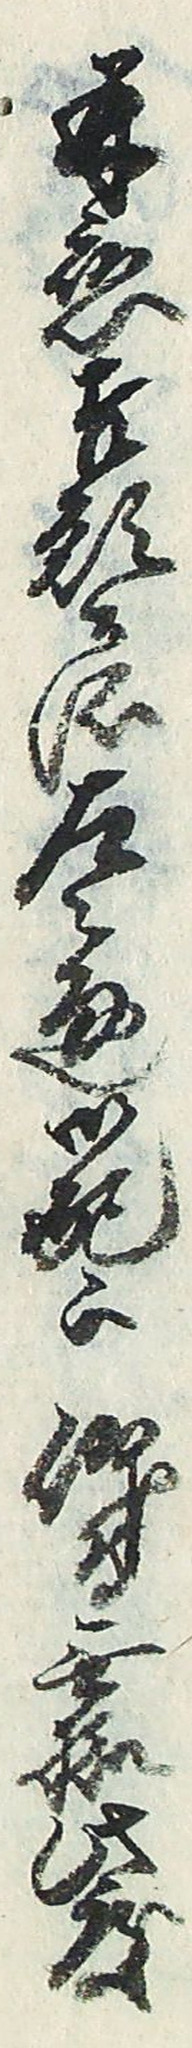再応奉願候所左の通御配被仰付無拠此度
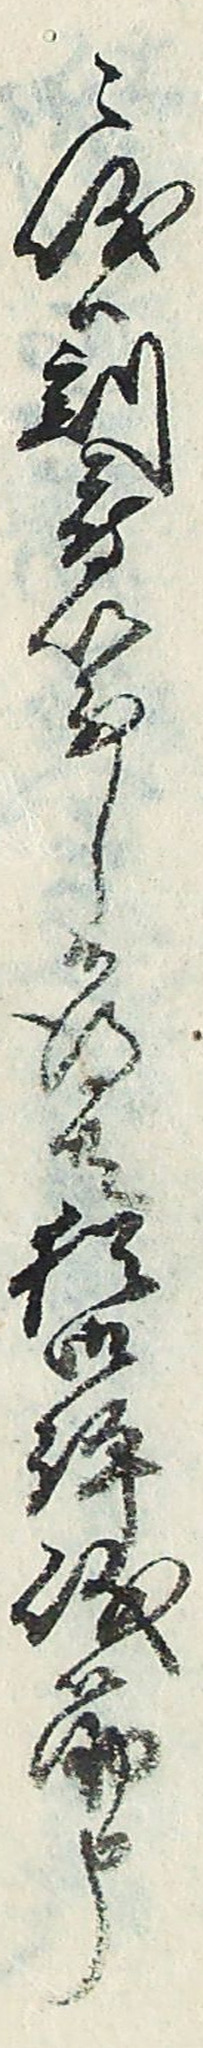の儀は割符いたし候得共猶御評儀筋申
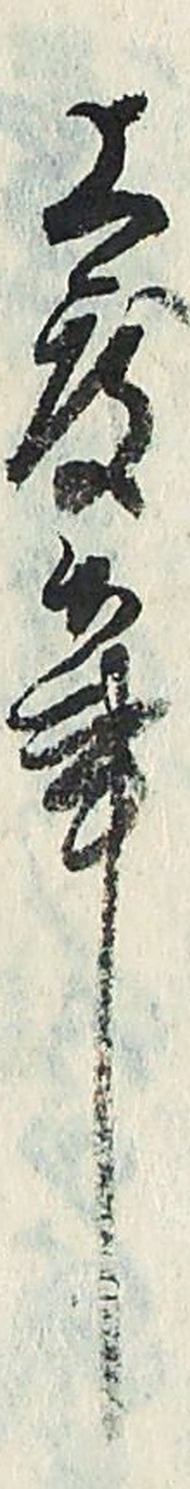上度候事
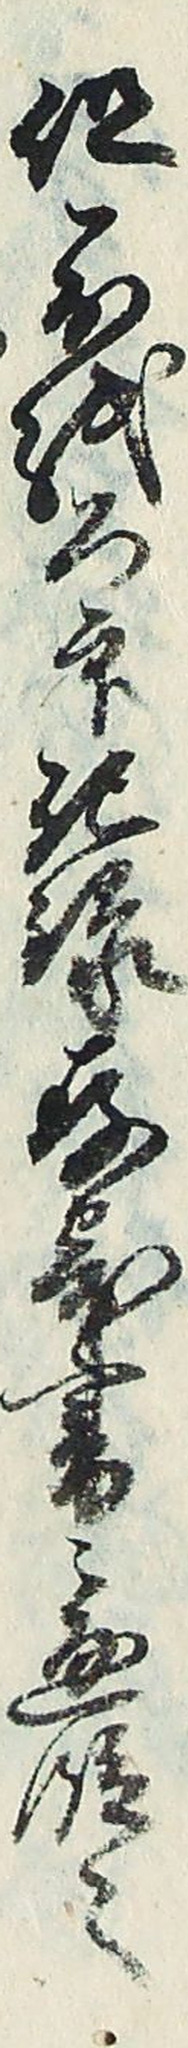但前紙ろ印記録存寄書の通段々
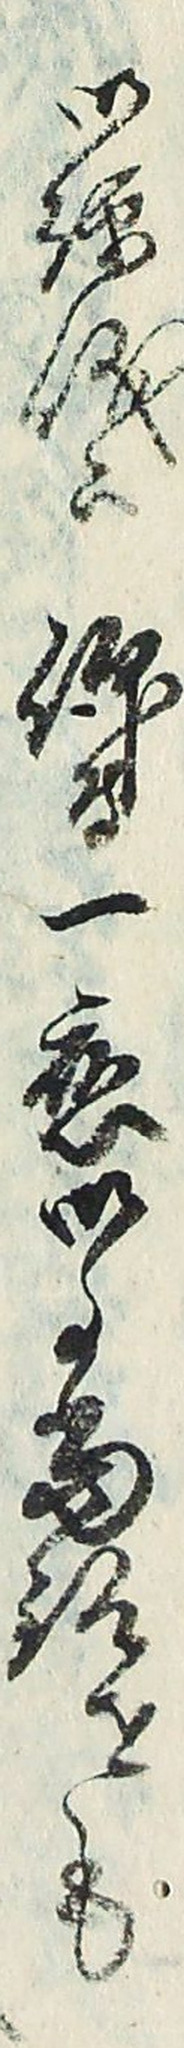御評儀被仰付一応御手当銀をも
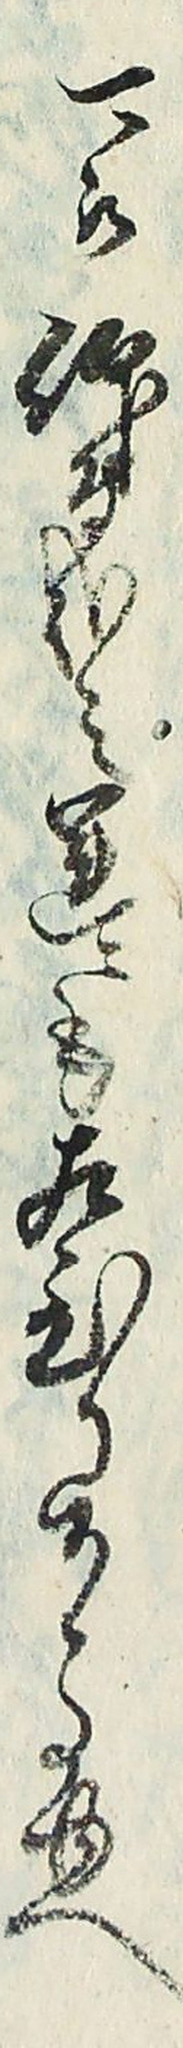可被仰付哉の運にも相至り候事ゆへ
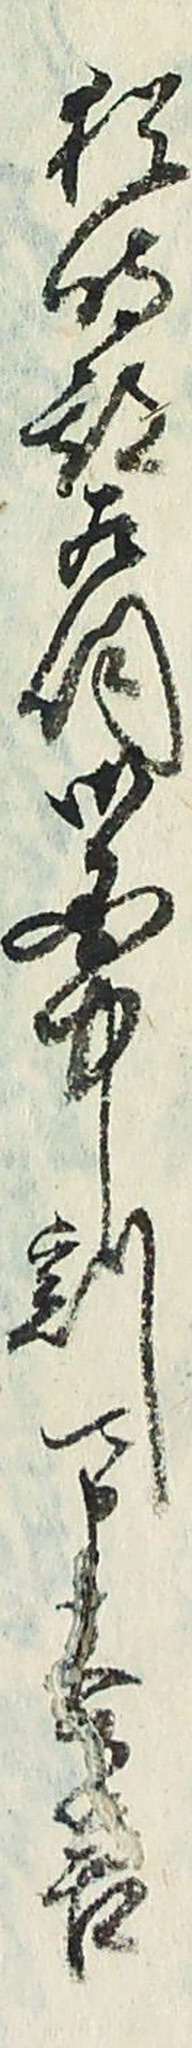猶時期相伺御国中割可申候筈
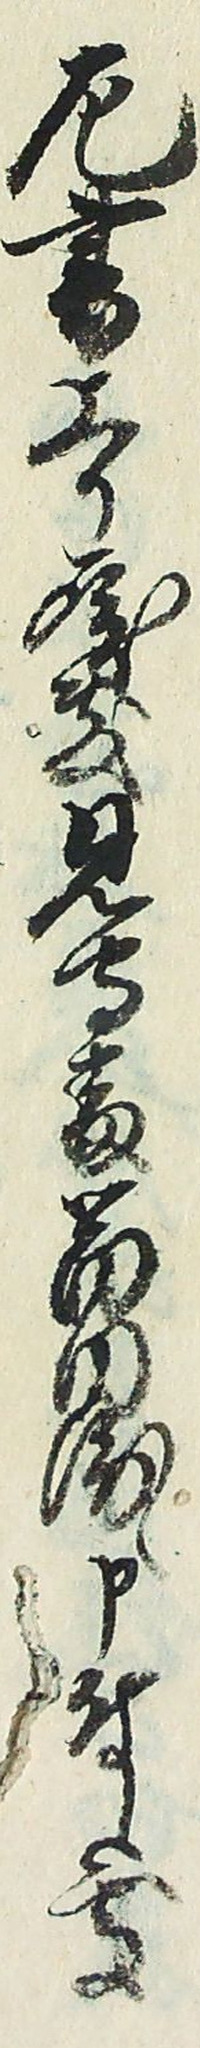左書上り屋敷見守番冨田浦へ申付候処
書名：諸割賦物賃銀定記録帳
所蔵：鳴門教育大学 Naruto University of Education
